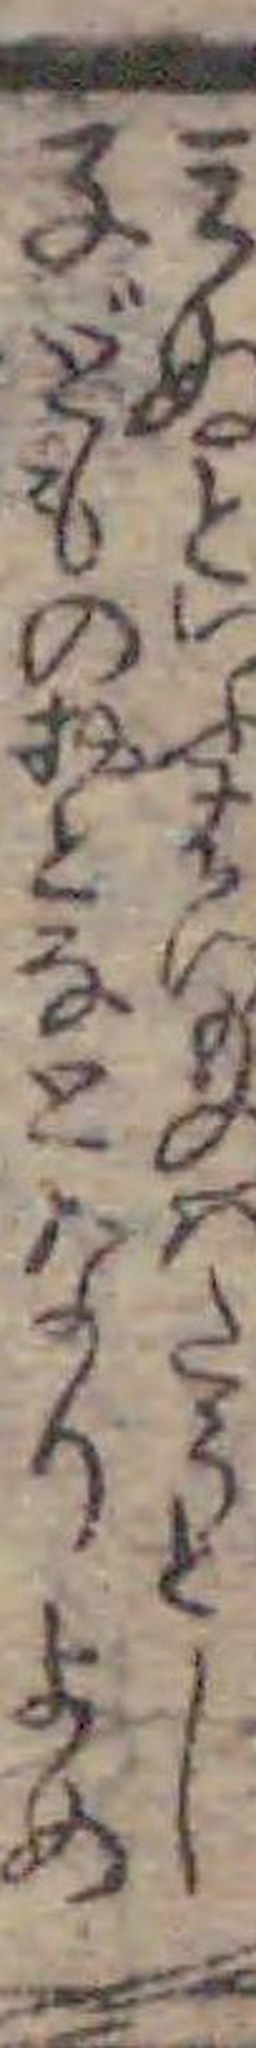子どものおとなとなりよめ
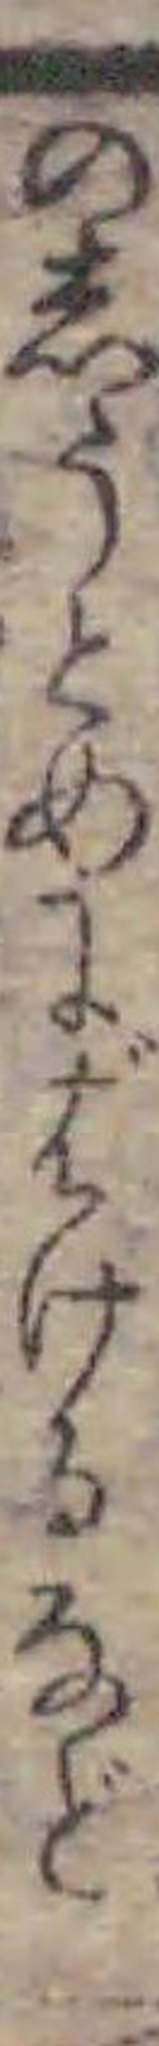のしうとめにばけるなど
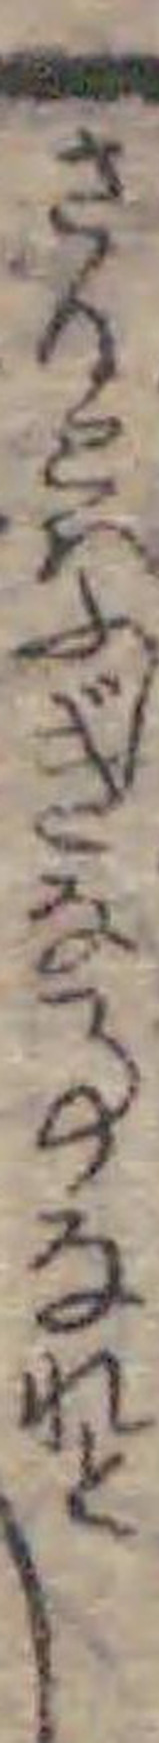さりとはふしぎなる事なれと
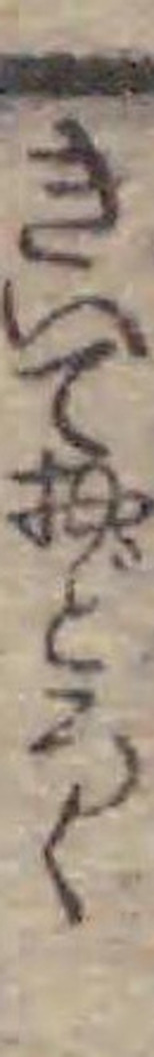きいておどろく
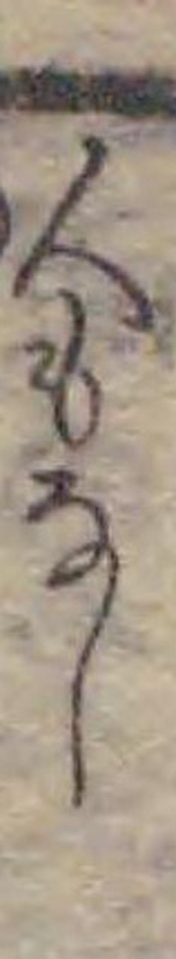人もなし
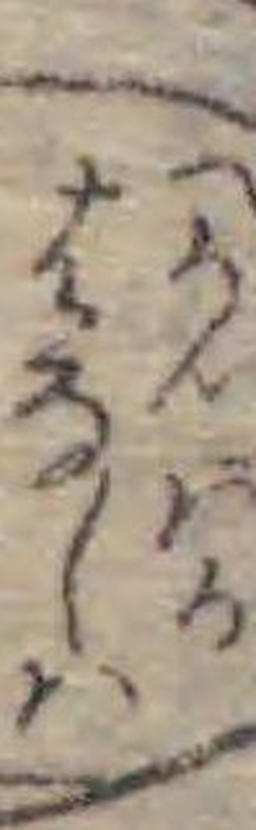はなしは
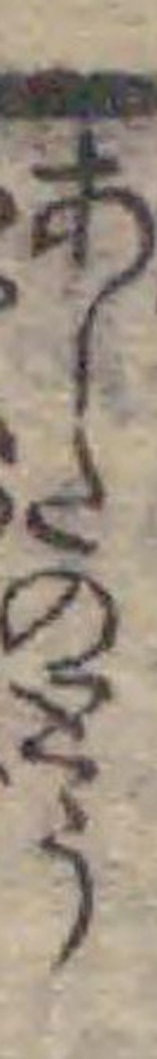あしたのとう
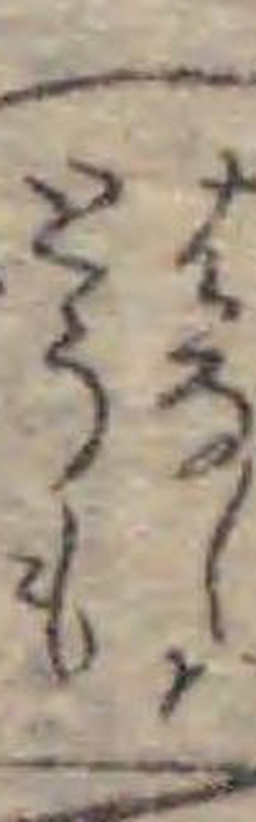とうも
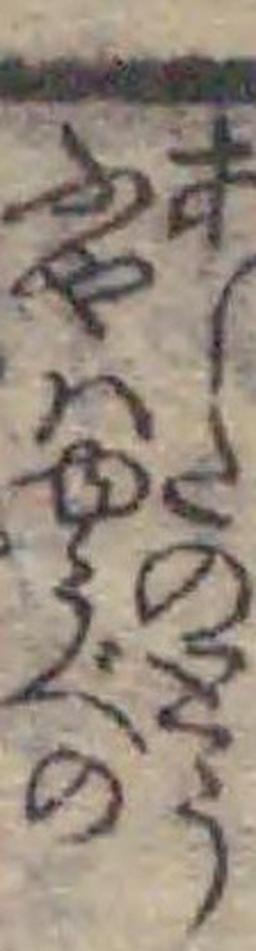ふやはゆうべの
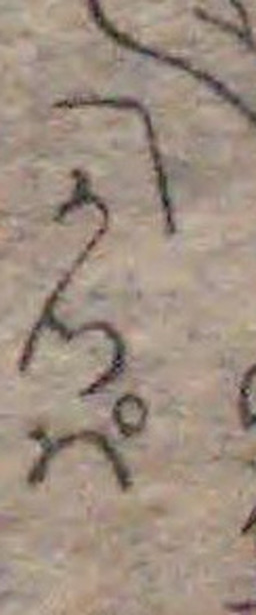〽かつぱ
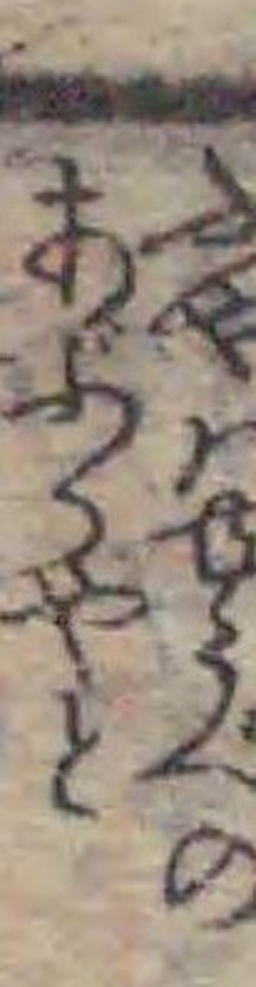あぶらやと
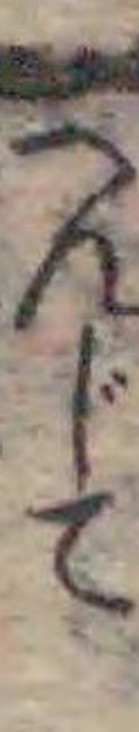へんじて
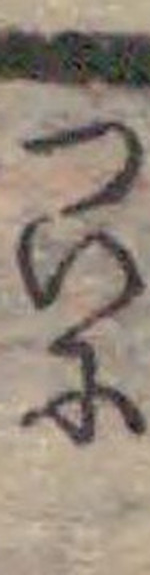ついに
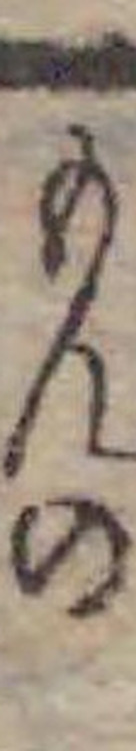もんの
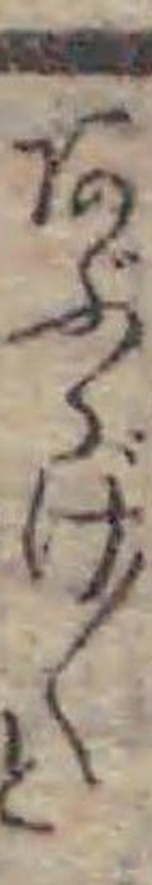あぶらげ〳〵と
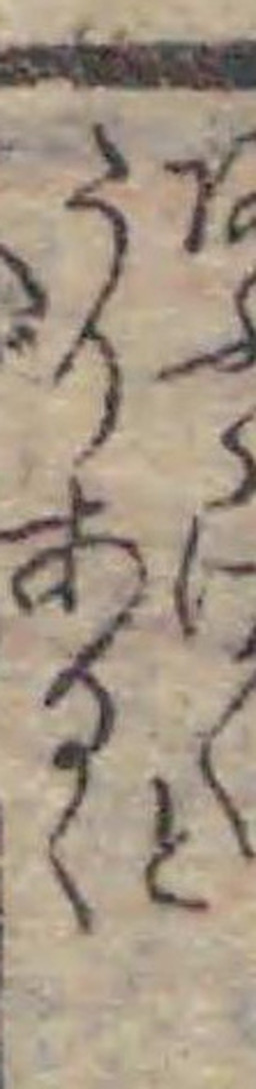うりあるく
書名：怪物つれつれ草 : 2巻
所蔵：国立国会図書館 National Diet Library, JAPAN
